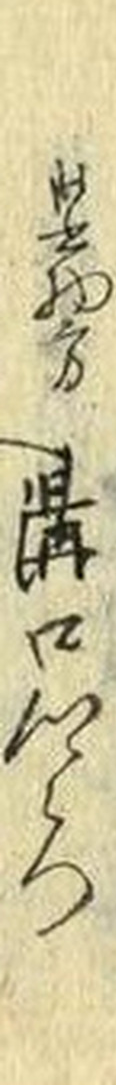御書物方溝口郷右衛門
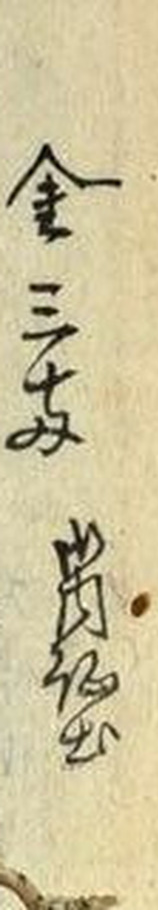金三両御内証出
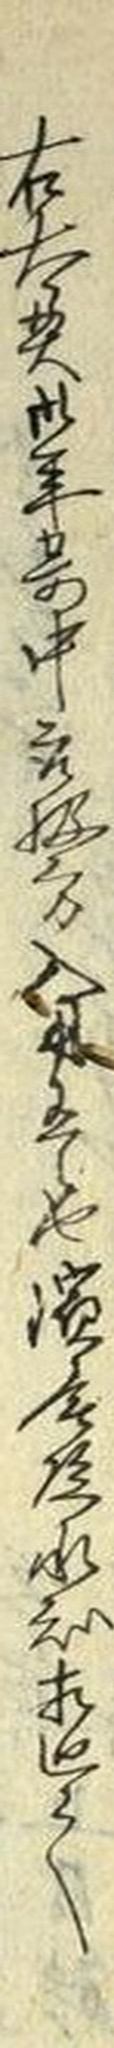右大奥御年寄中取扱方入用有之由浜尾殿承知相廻之
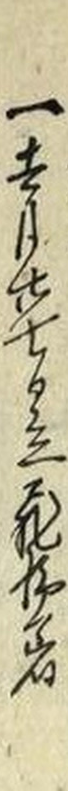一去月廿七日立飛脚着
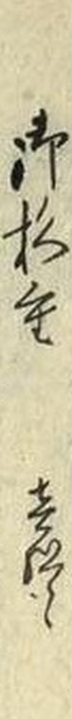御杉重壱組ツヽ
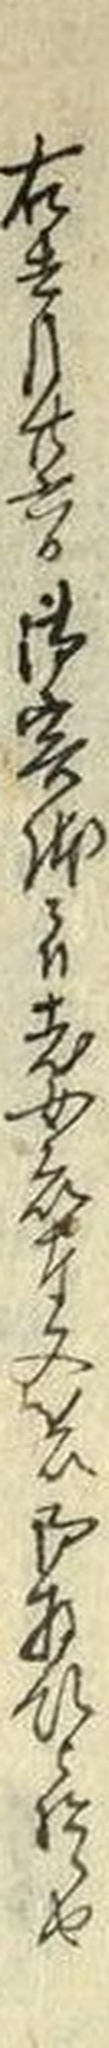右去月廿六日御容体ニ付老女衆奉文を以御拝領被遊候由
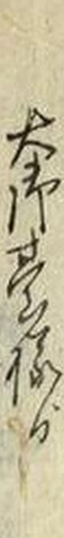大御台様ゟ
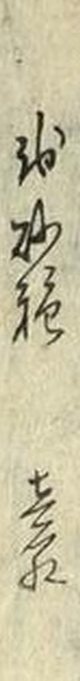氷砂糖壱箱
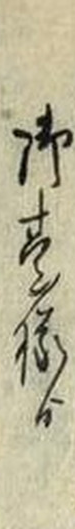御台様ゟ
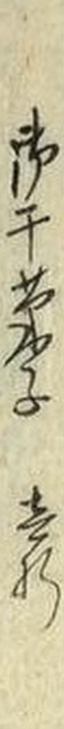御干菓子壱折
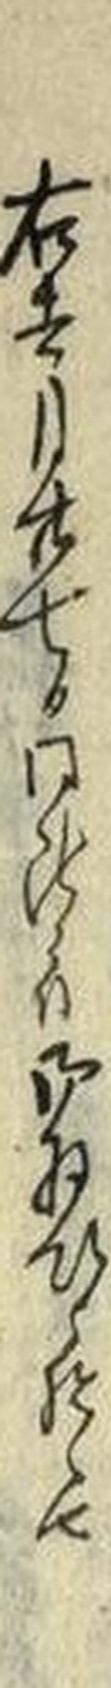右去月廿七日同断ニ付御拝領被遊候由
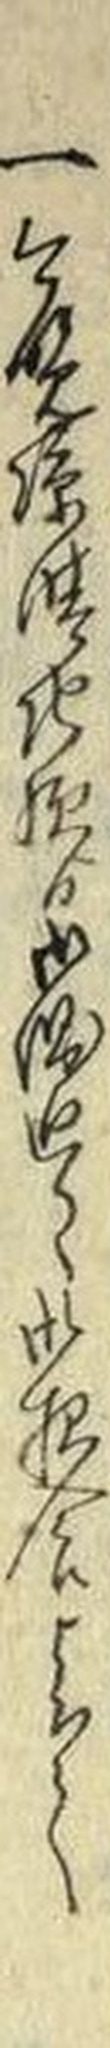一今晩涼晴院様ゟ御側廻り之御夜食被下之
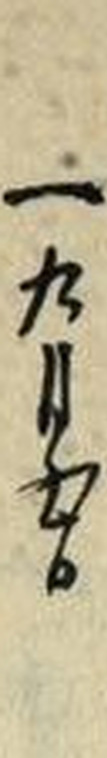一九月五日

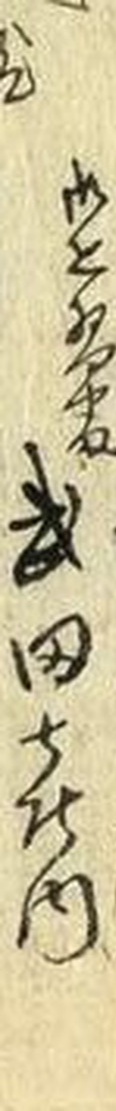御近習番武田喜内
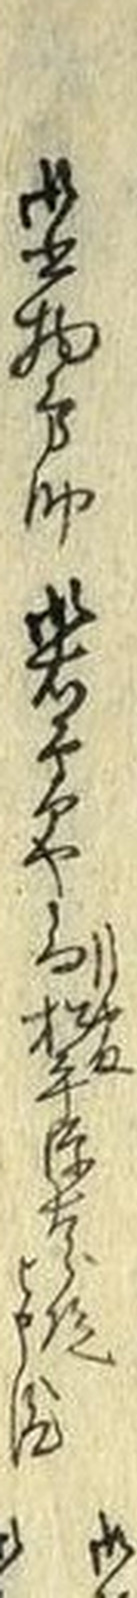御書物方助御右筆部やニ而月番松平源太郎殿被申渡
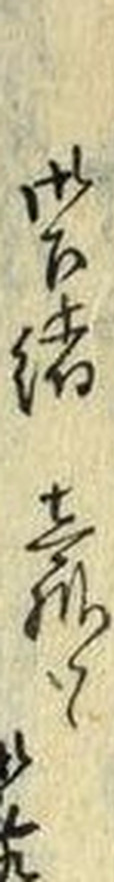御下緒壱掛ツヽ
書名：少傅日録抄（斉善付側向頭取日記、江戸并道中、初入在国、逝去後…
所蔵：福井県文書館 Fukui Prefectural Archives
